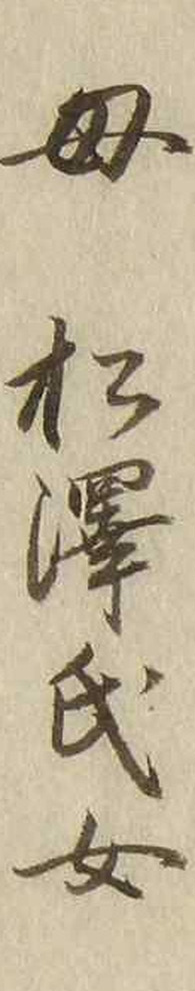母松沢氏女

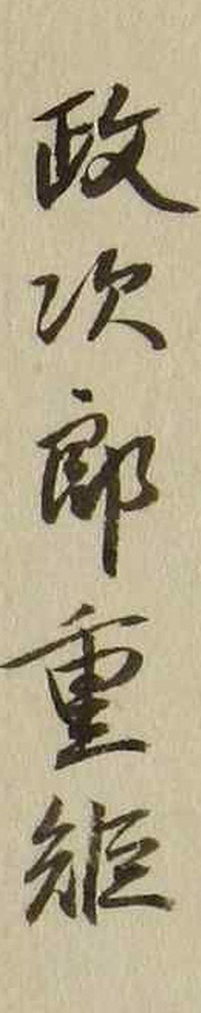政次郎重矩
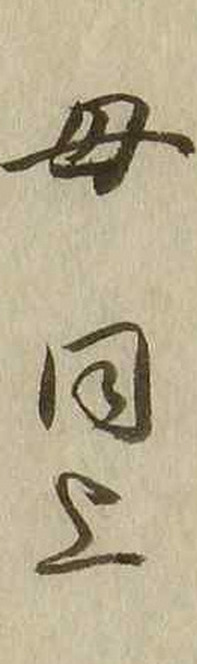母同上
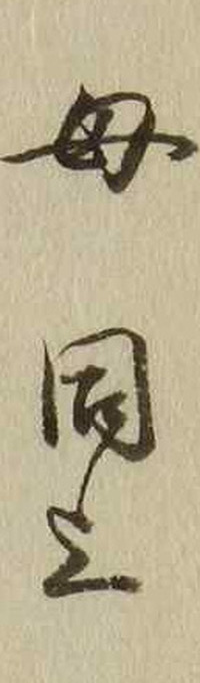母同上
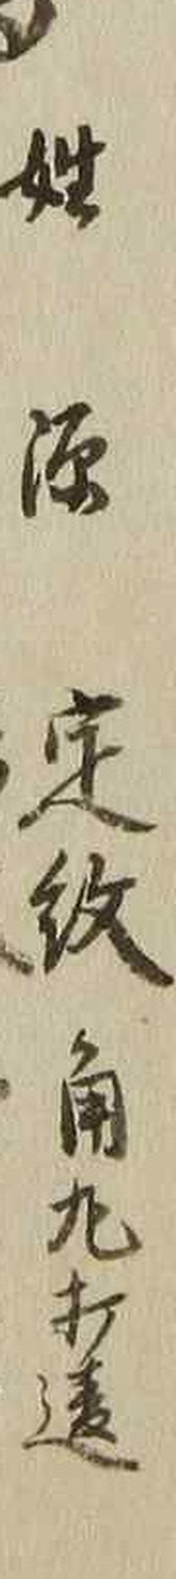姓源定紋角丸打違
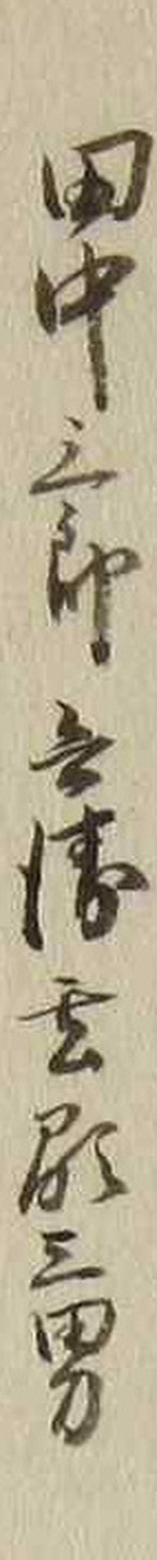田中三郎兵衛玄顕三男
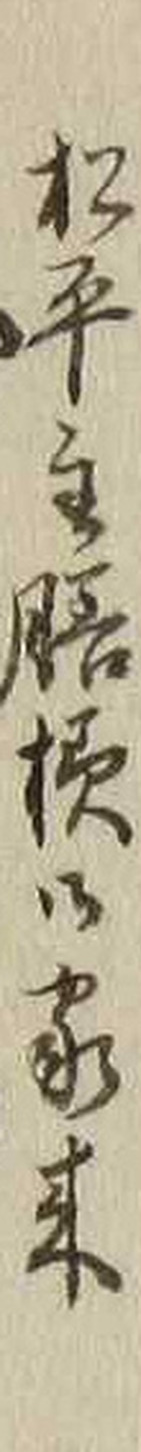松平主膳様御御家
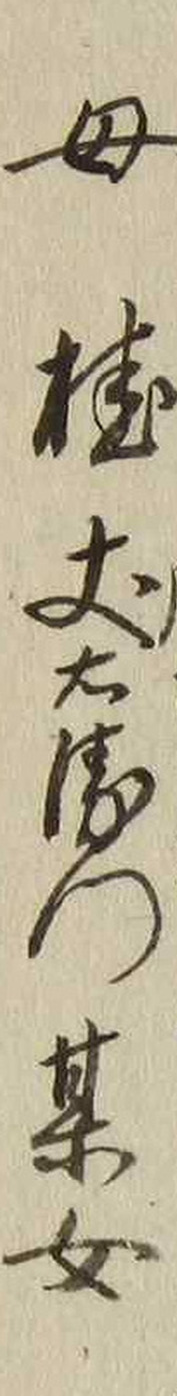母桂丈右衛門某女
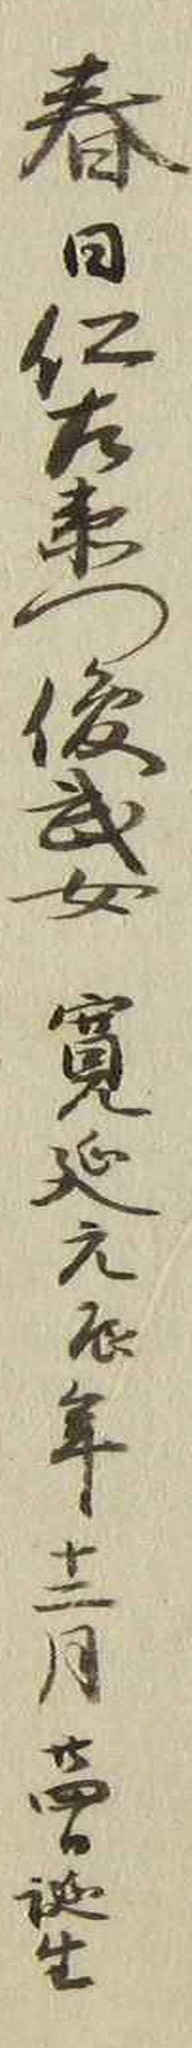春日仁左衛門俊武女寛延元辰年十二月廿四日誕生
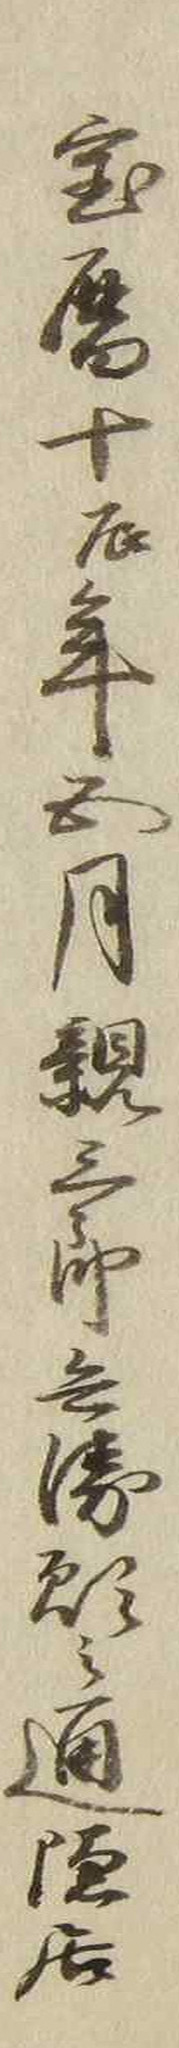一宝暦十辰年五月親三郎兵衛願之通隠居
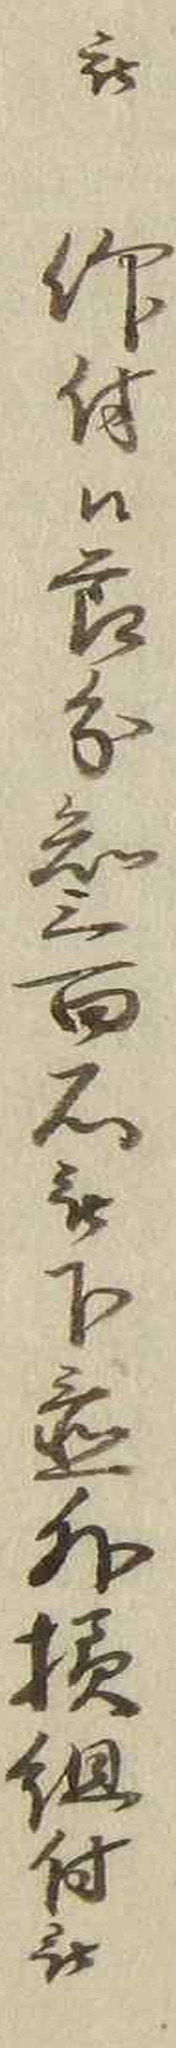被仰付候節分知三百石被下置外様組付被

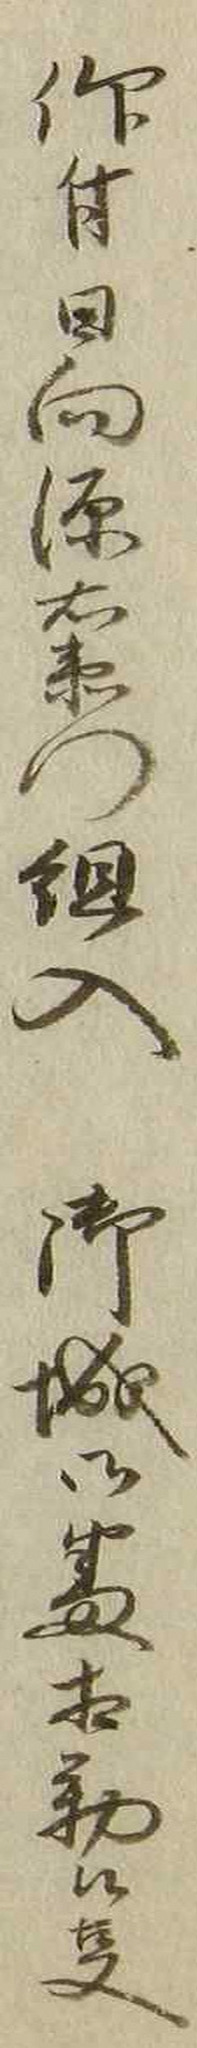仰付日向源右衛門組入御城御番相勤候事
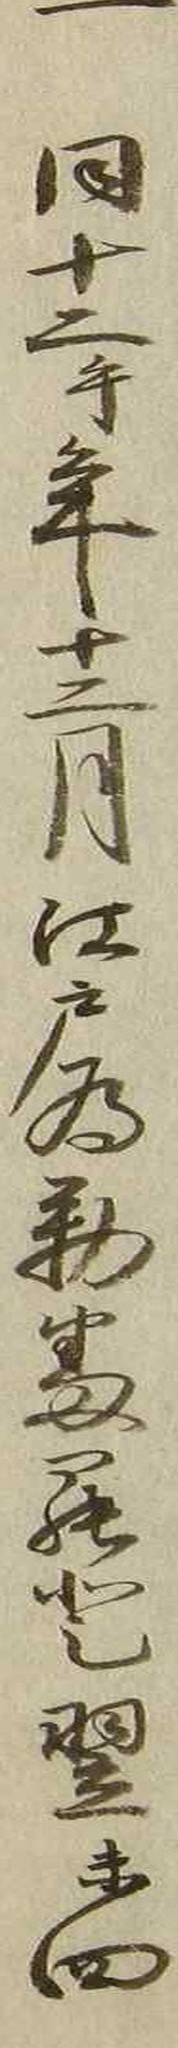一同十二午年十二月江戸為勤番罷登翌未四
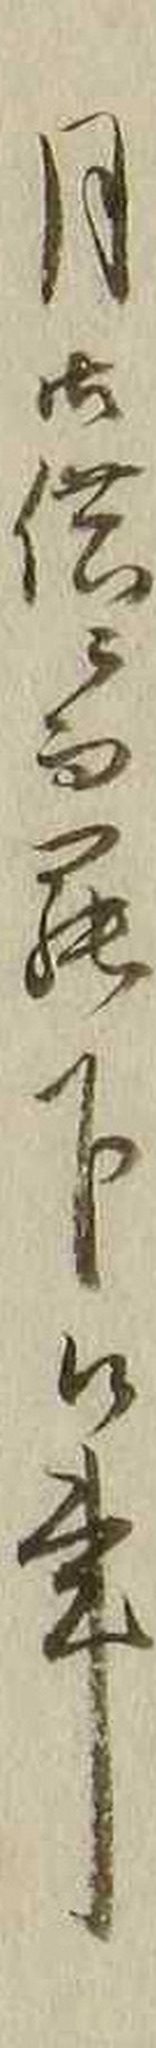月御供に而罷下候事
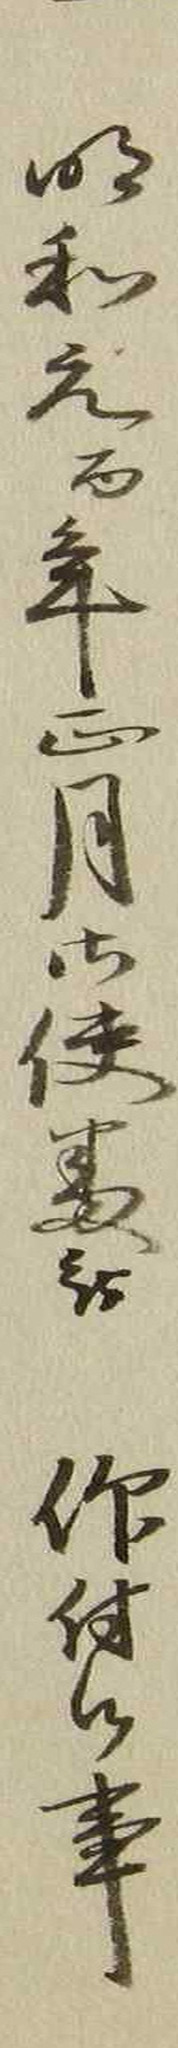一明和元酉年正月御使番被仰付候事
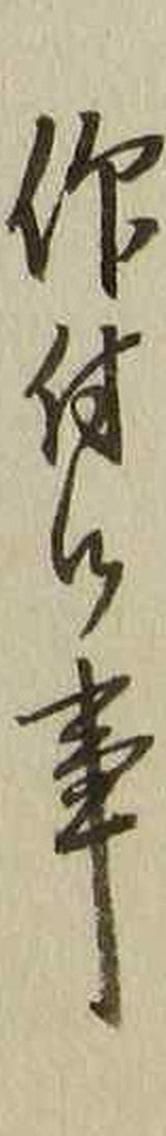仰付候事
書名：諸士系譜　巻之133　た之部9
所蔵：会津若松市立会津図書館
